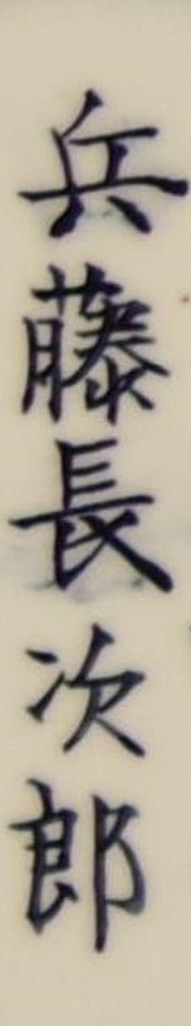兵藤長次郎
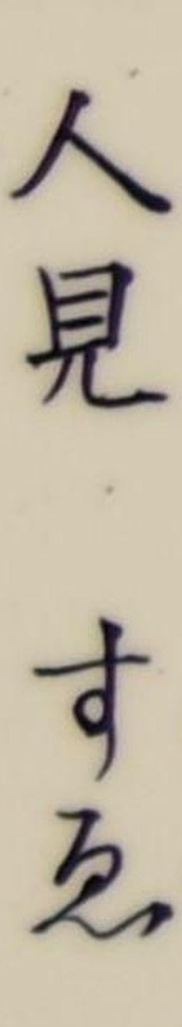人見すゑ
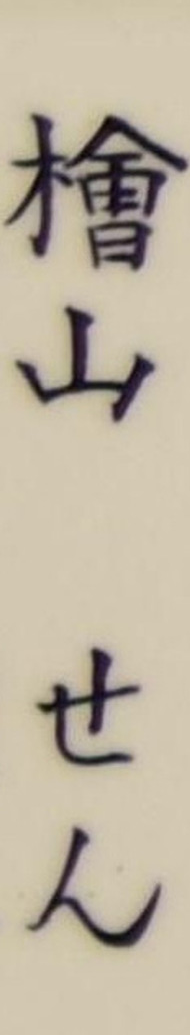檜山せん
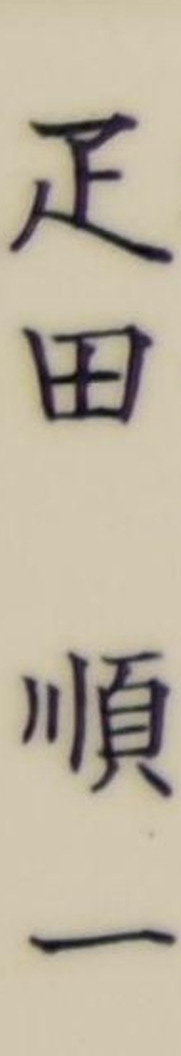疋田順一
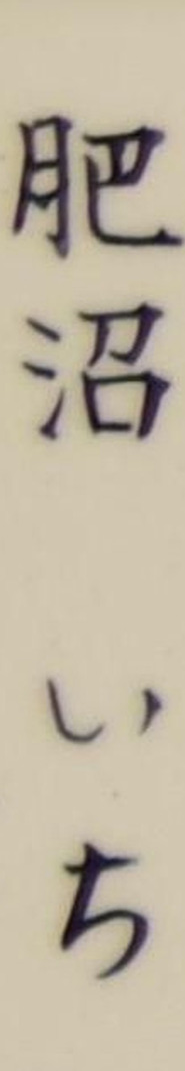肥沼いち
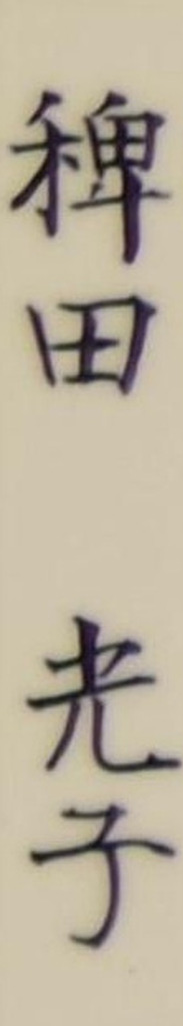稗田光子

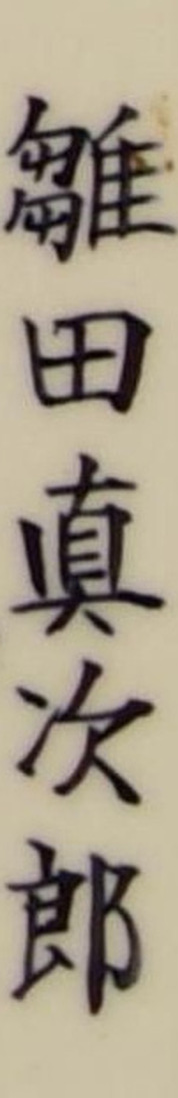雛田真次郎
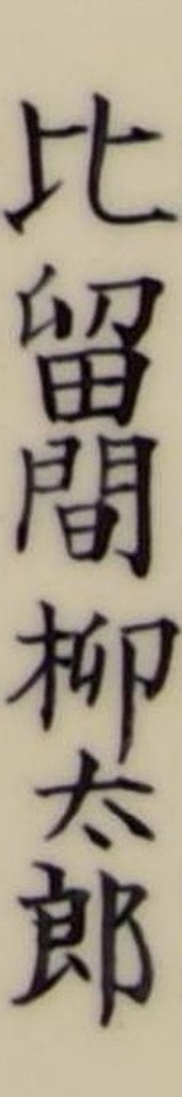比留間柳太郎
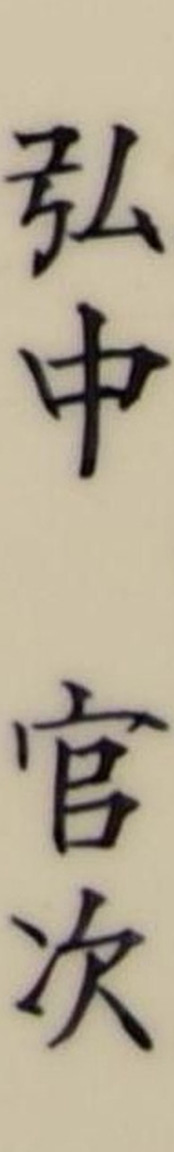弘中官次
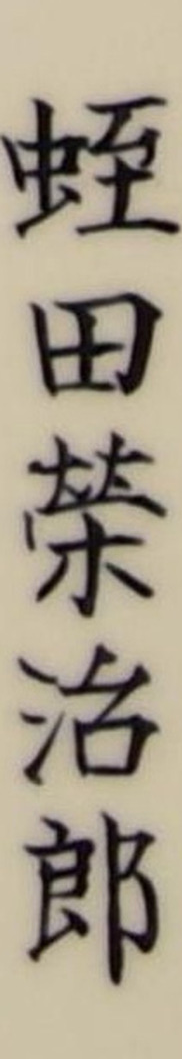蛭田榮治郎
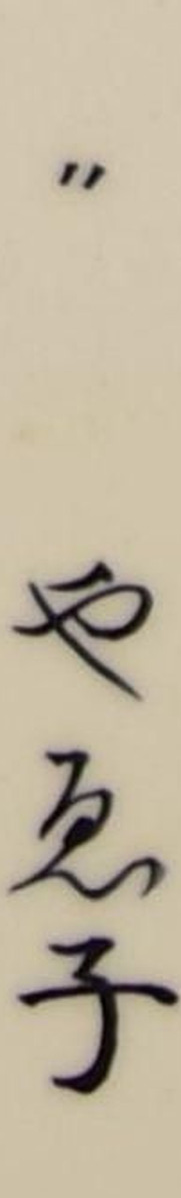やゑ子
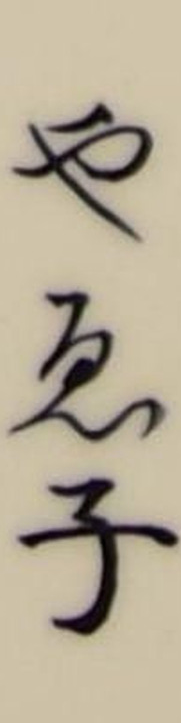やゑ子
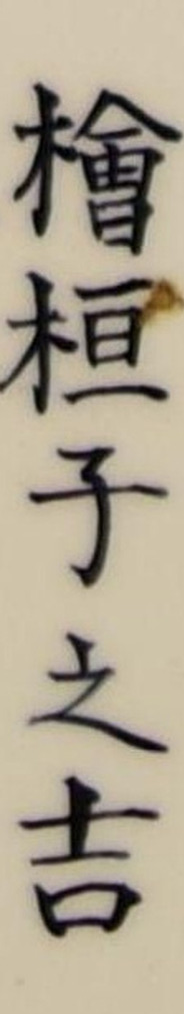檜桓子之吉
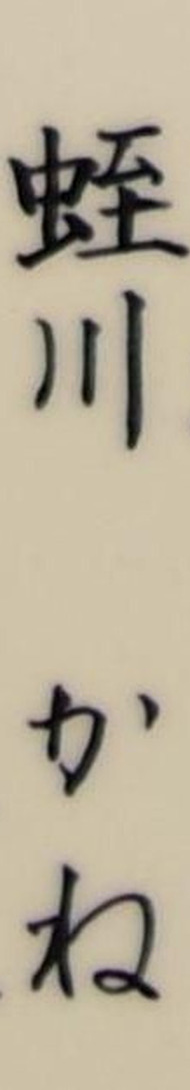蛭川かね
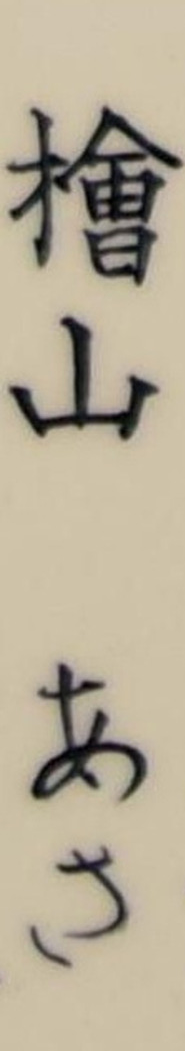檜山あさ
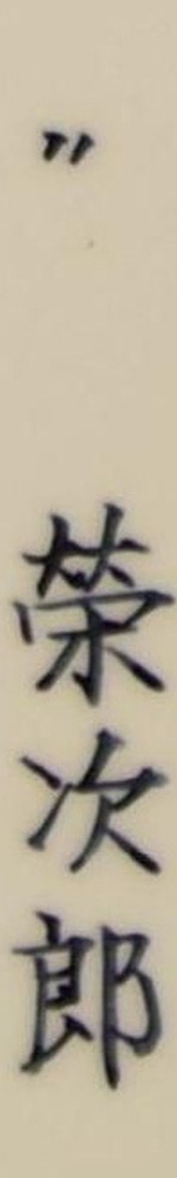榮次郎
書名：A~D
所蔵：koyasan kongobuji
